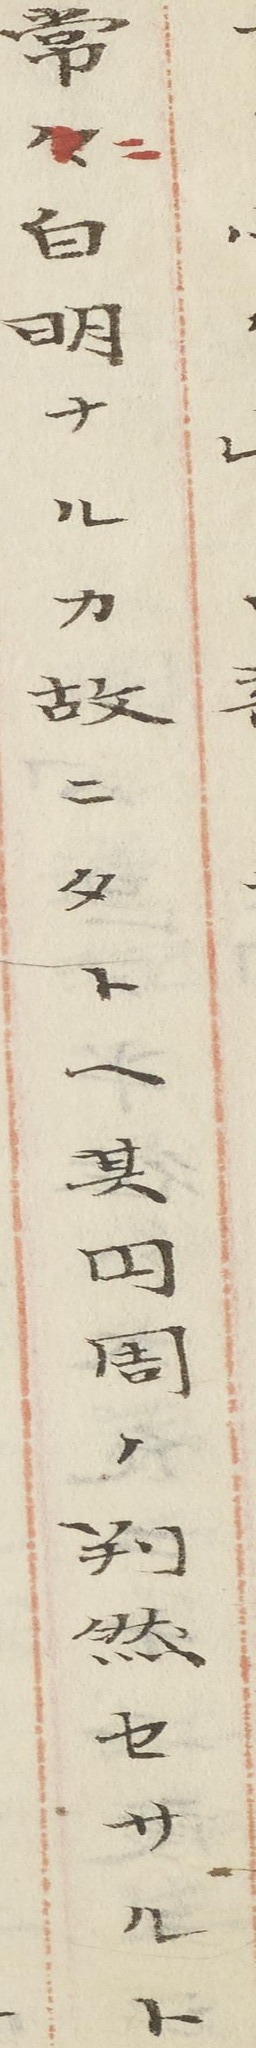常々白明ナルカ故ニタトヘ其円周ノ判然セサルト
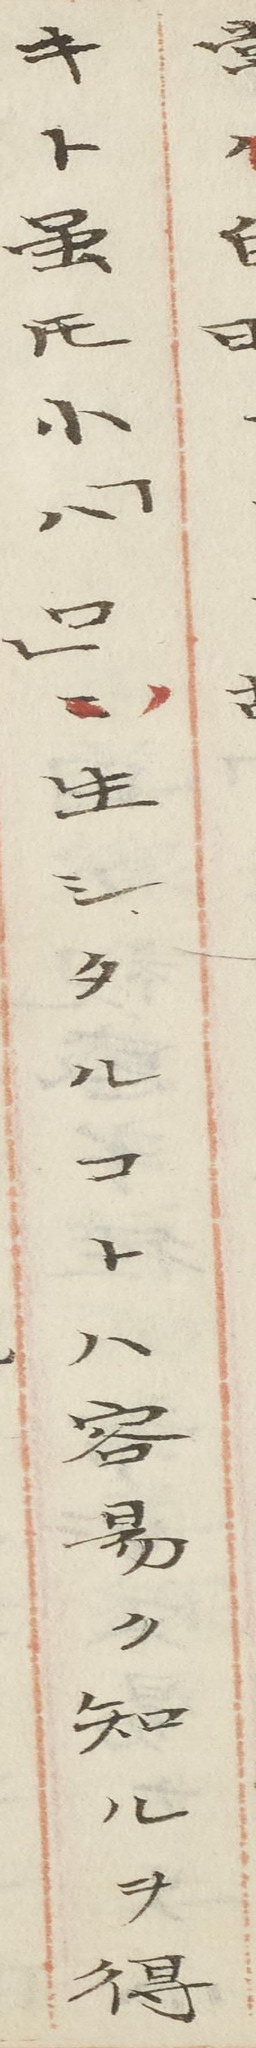キト雖トモ小「ハロ」ニ生シタルコトハ容易ク知ルヲ得
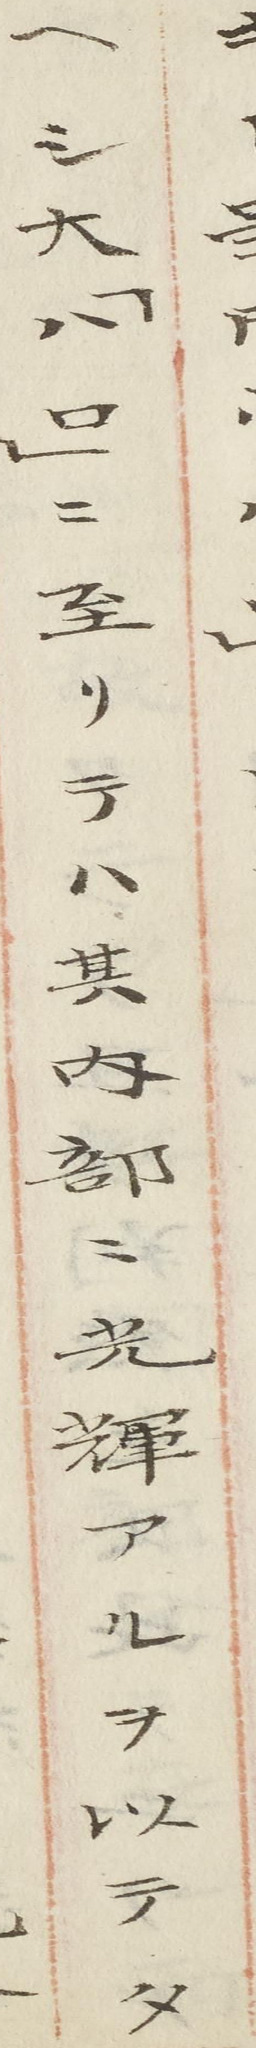ヘシ大「ハロ」ニ至リテハ其内部ニ光輝アルヲ以テタ
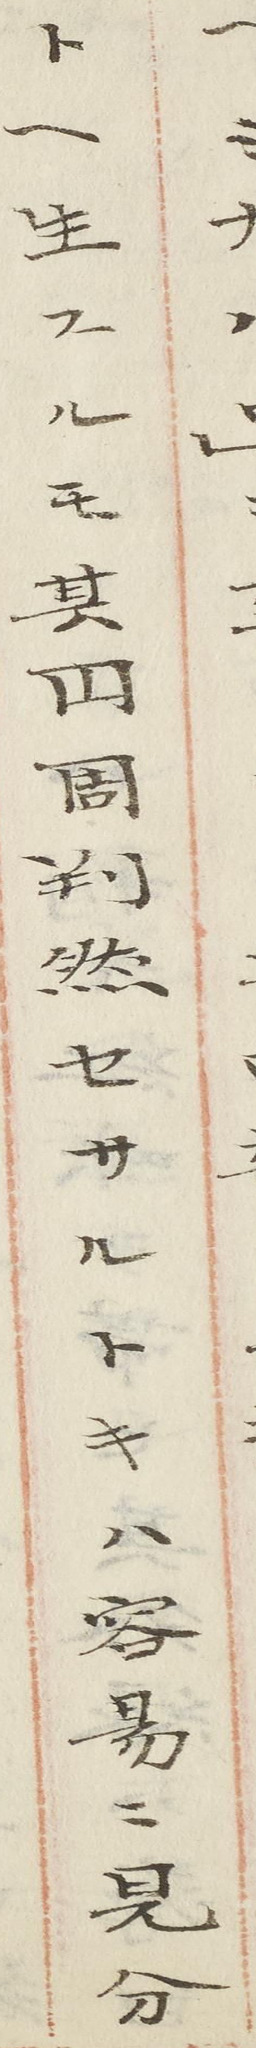トヘ生スルモ其円周判然セサルトキハ容易ニ見分
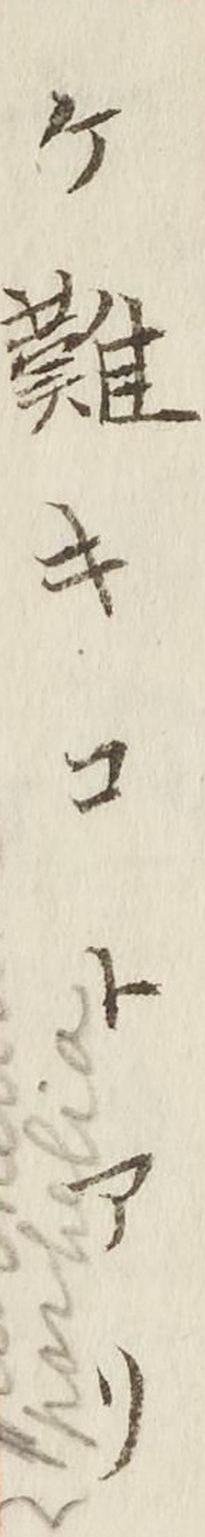ケ難キコトアリ
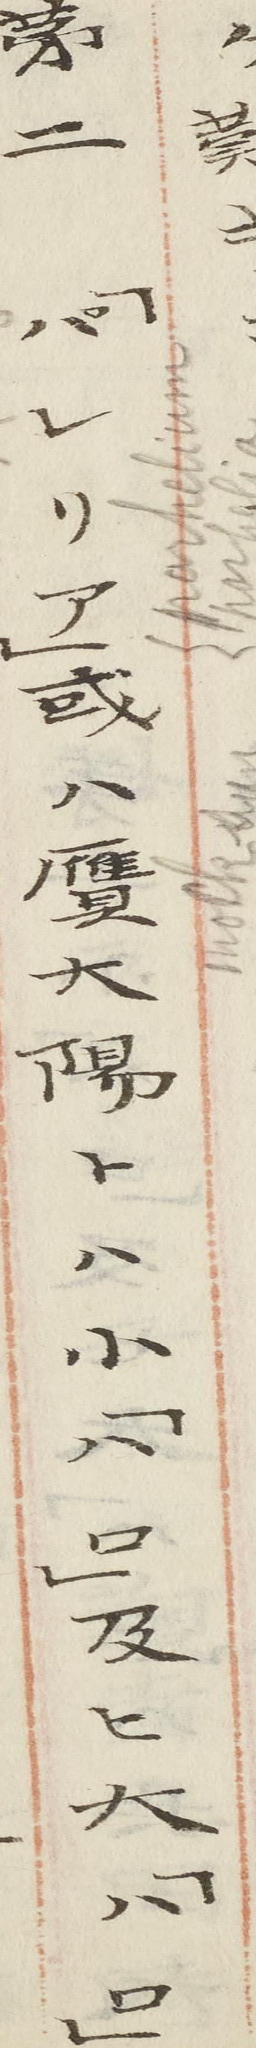第二「パレリア」或ハ贋大陽トハ小「ハロ」及ヒ大「ハロ」
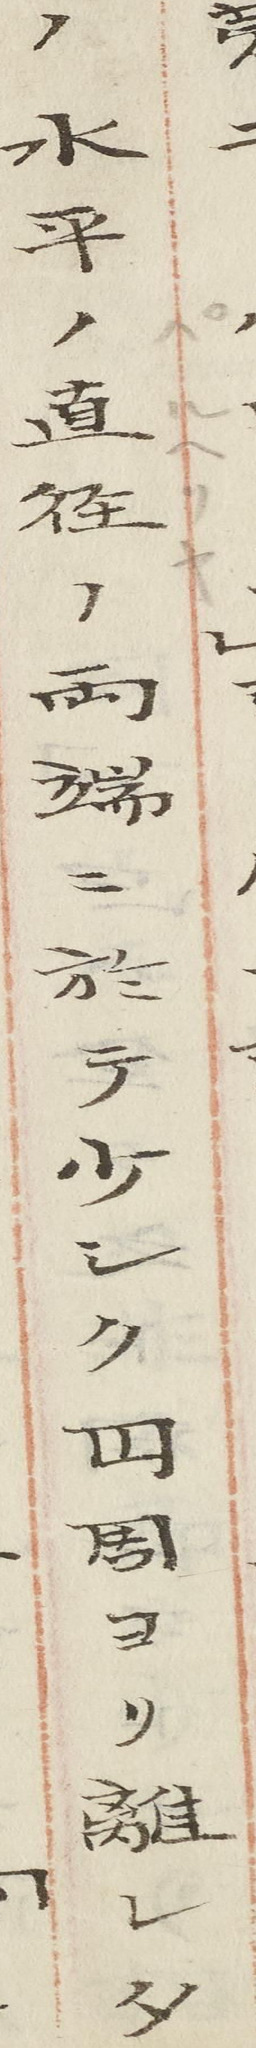ノ水平ノ直径ノ両端ニ於テ少シク円周ヨリ離レタ
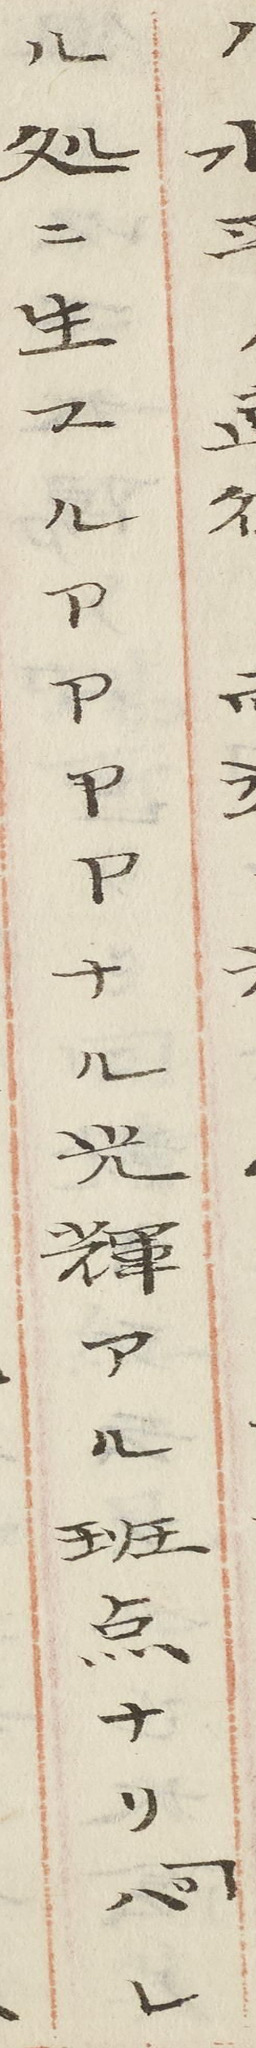ル処ニ生スルＰＰＰＰナル光輝アル斑点ナリ「パレ
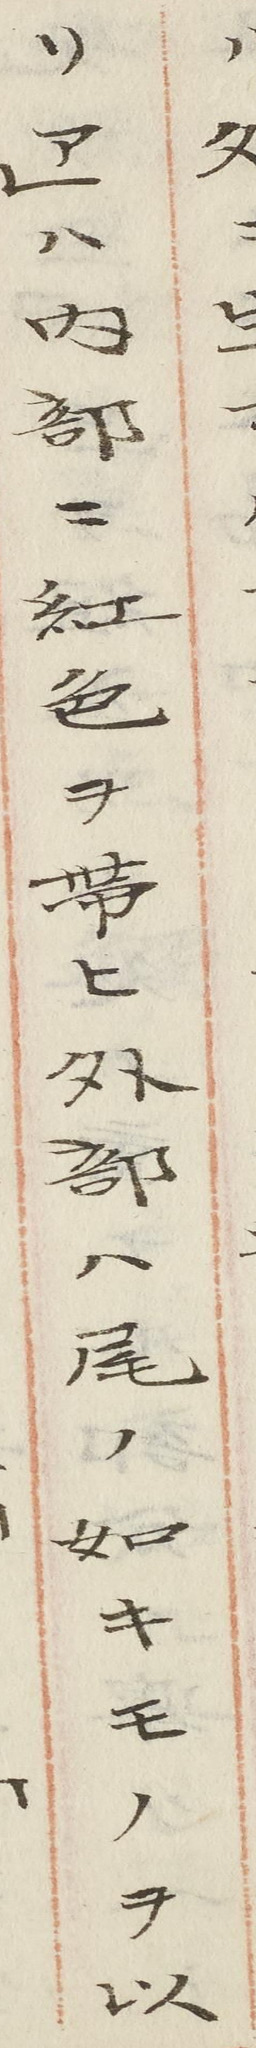リア」ハ内部ニ紅色ヲ帯ヒ外部ハ尾ノ如キモノヲ以
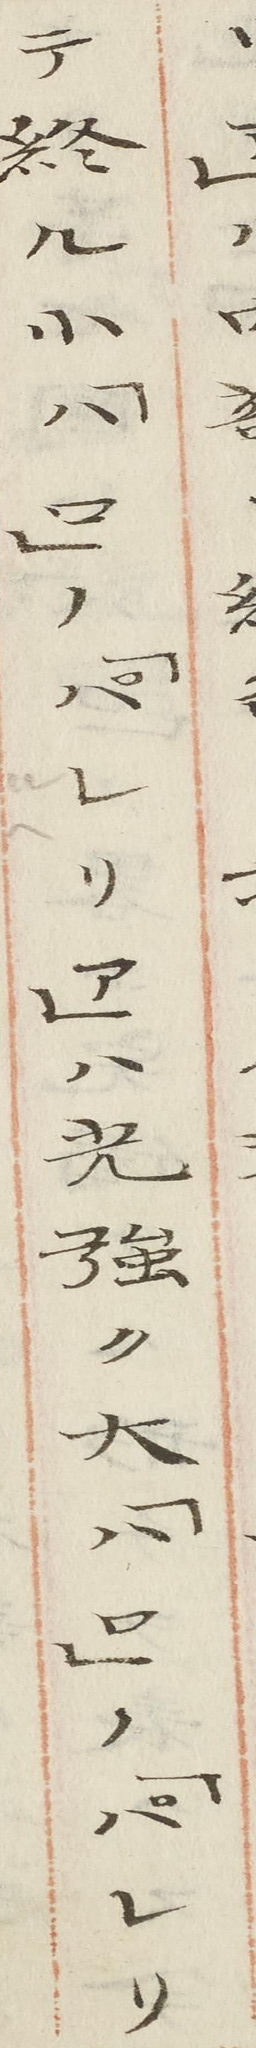テ終ル小「ハロ」ノ「パレリア」ハ光強ク大「ハロ」ノ「パレリ
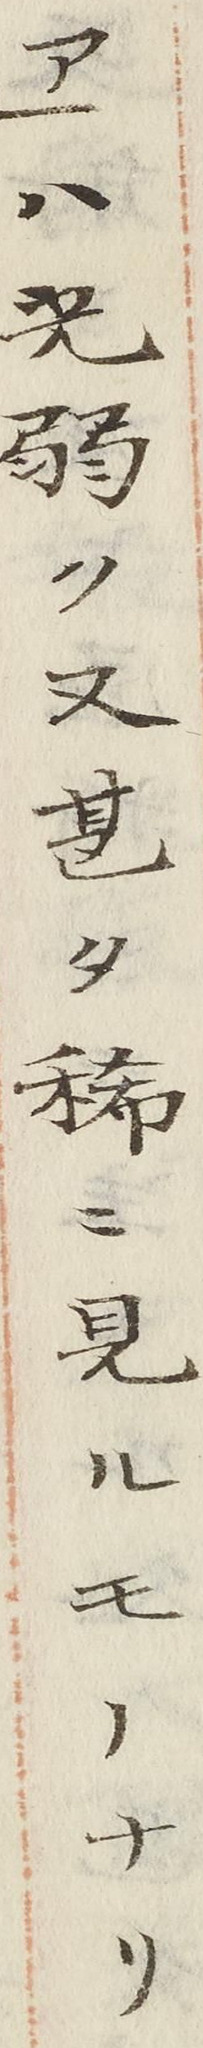ア」ハ光弱ク又甚タ稀ニ見ルモノナリ
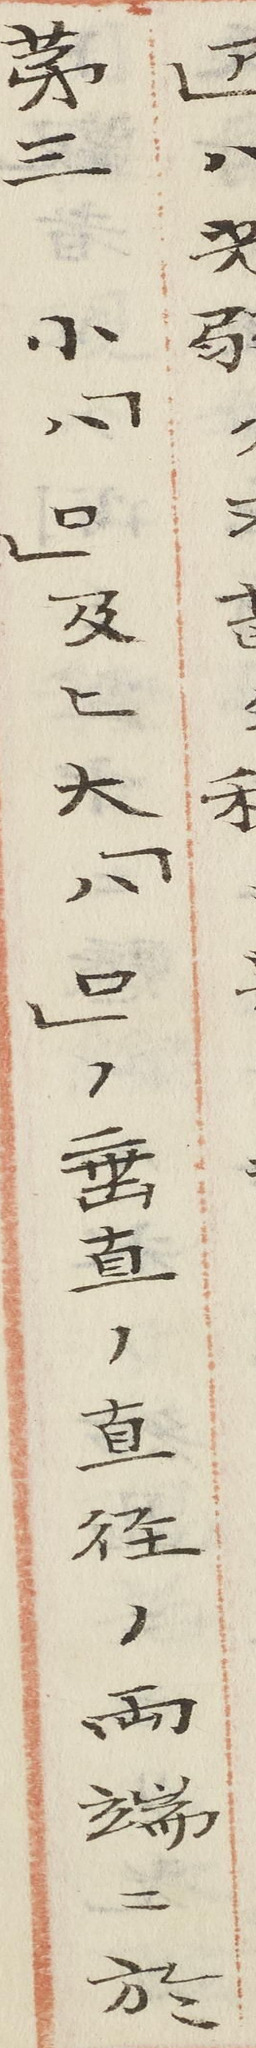第三小「ハロ」及ヒ大「ハロ」ノ垂直ノ直径ノ両端ニ於
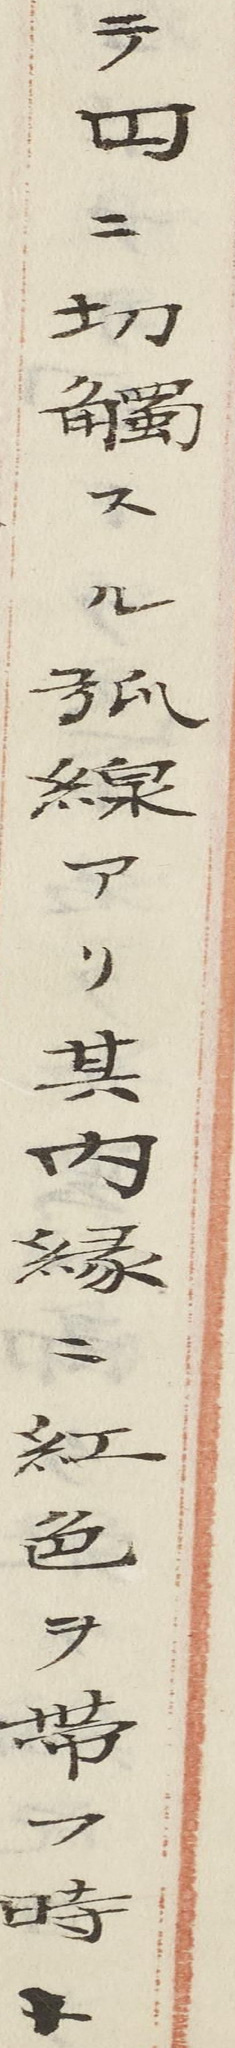テ円ニ切触スル孤線アリ其内縁ニ紅色ヲ帯フ時ト
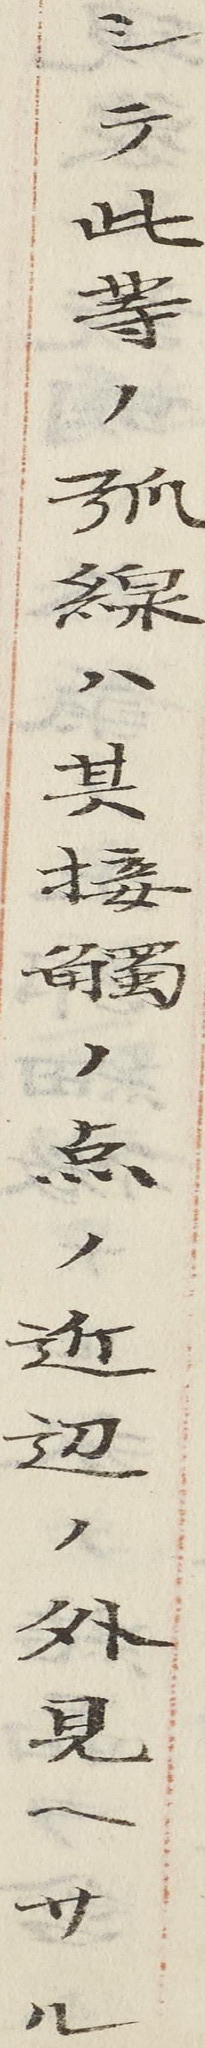シテ此等ノ弧線ハ其接触ノ点ノ近辺ノ外見ヘサル
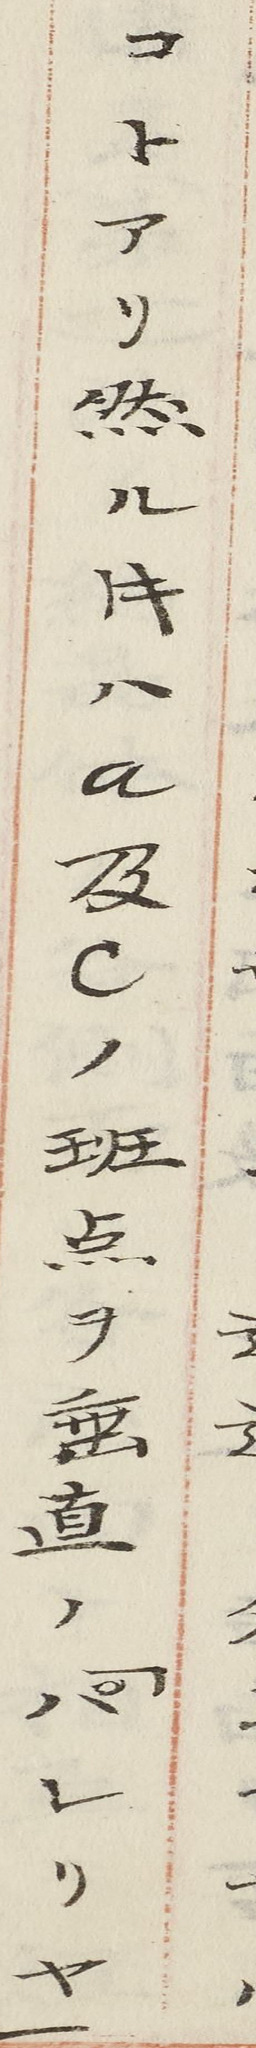コトアリ然ルトキハａ及ｃノ斑点ヲ垂直ノ「パレリヤ」
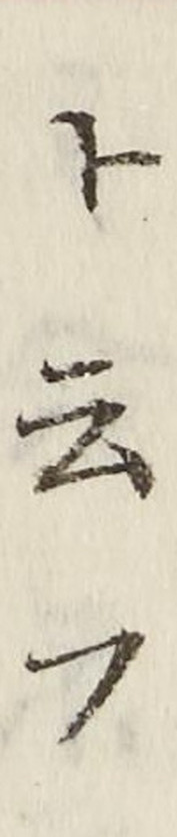ト云フ
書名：虹及ハロノ説明
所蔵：東京大学地震研究所図書室 Earthquake Research Institute Library, The University of Tokyo, JAPAN
